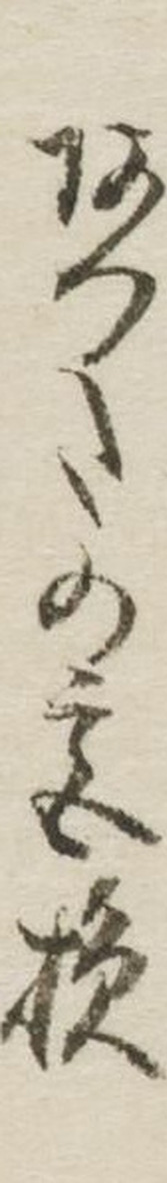あつたの宮損
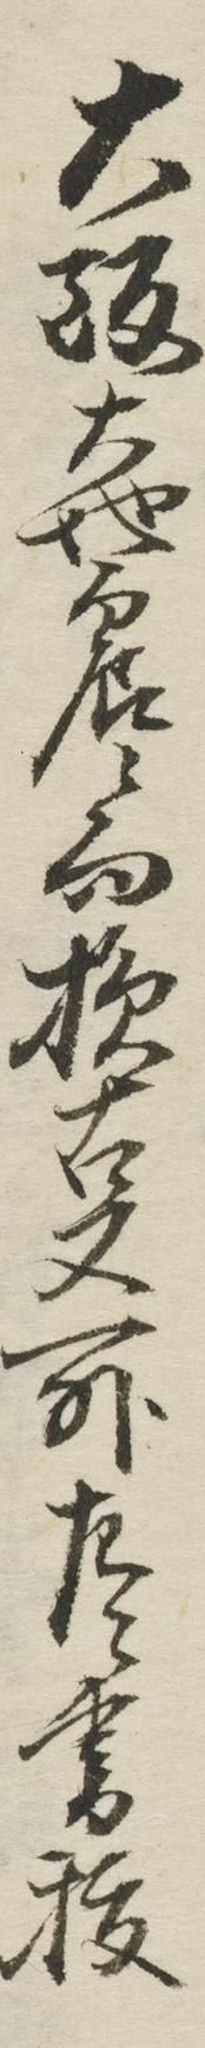大阪大地震ニ而損事所左二書抜

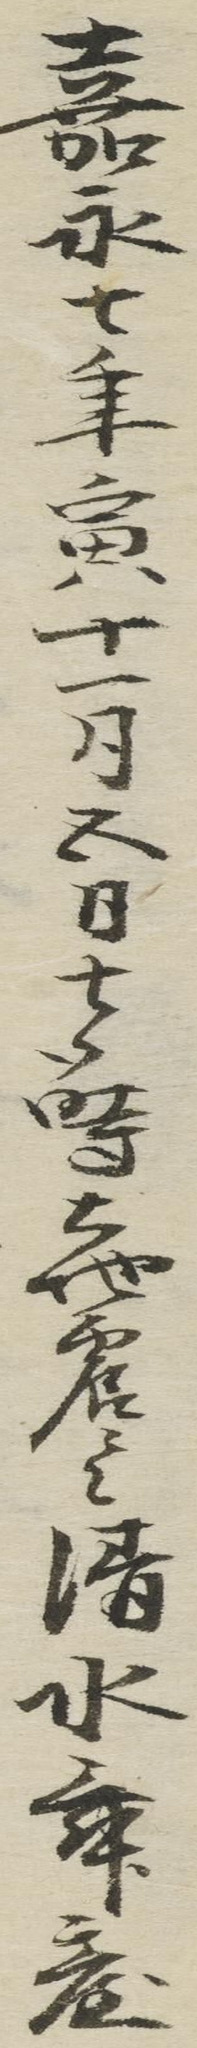嘉永七寅十一月五日七ツ時大地震ニて清水舞台
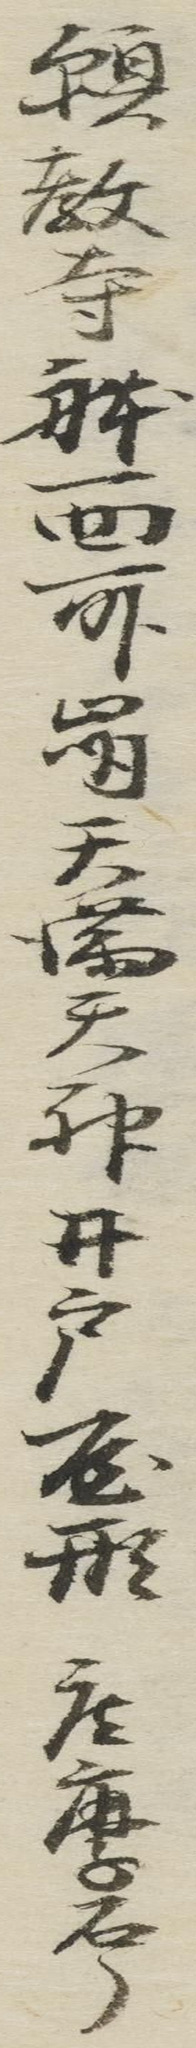願教寺体面所崩天満天神井戸屋形座摩石ノ
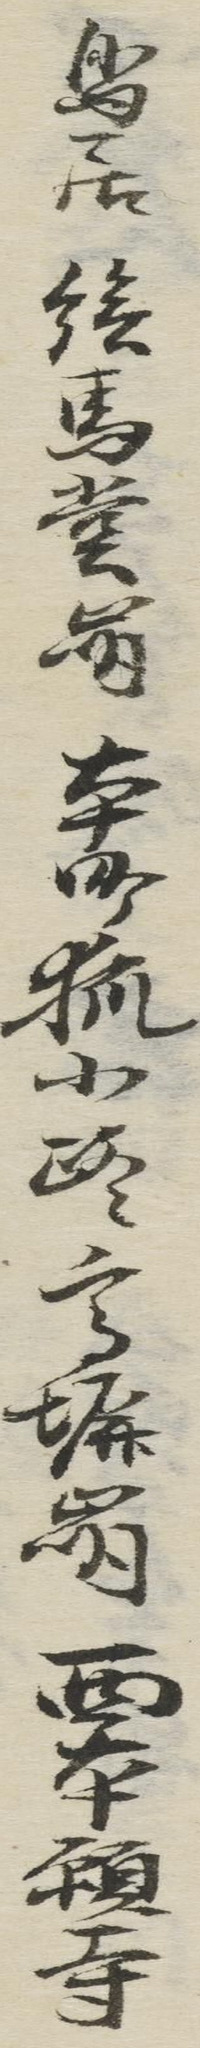鳥居絵馬堂崩本町狐小路高塀崩西本願寺
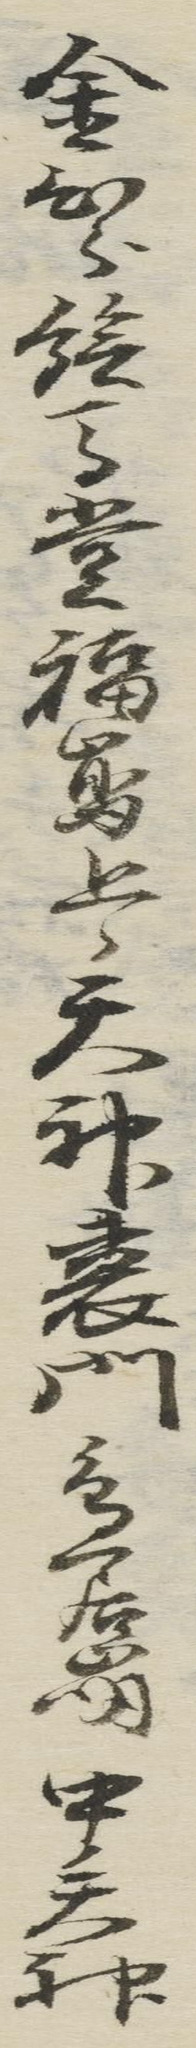金ひら絵馬堂福嶌上ノ天神裏門鳥居崩中ノ天神
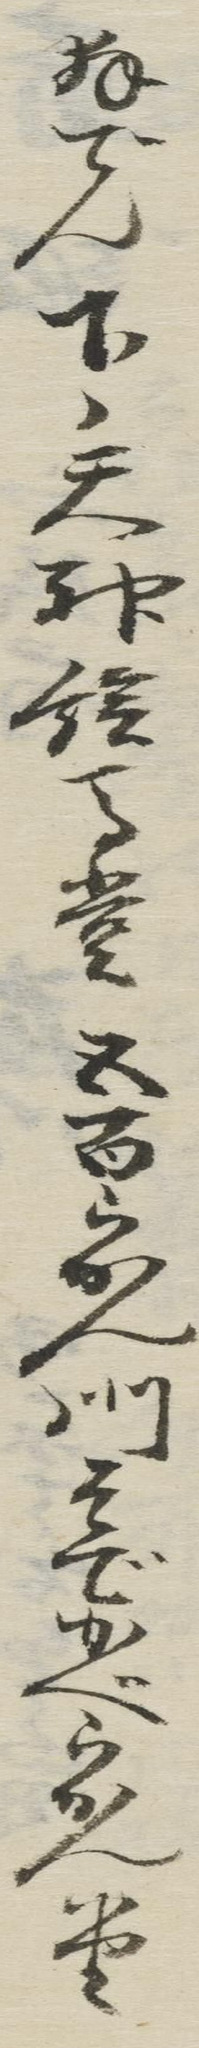拝でん下ノ天神絵馬堂五百らかん門そでかべらかん堂
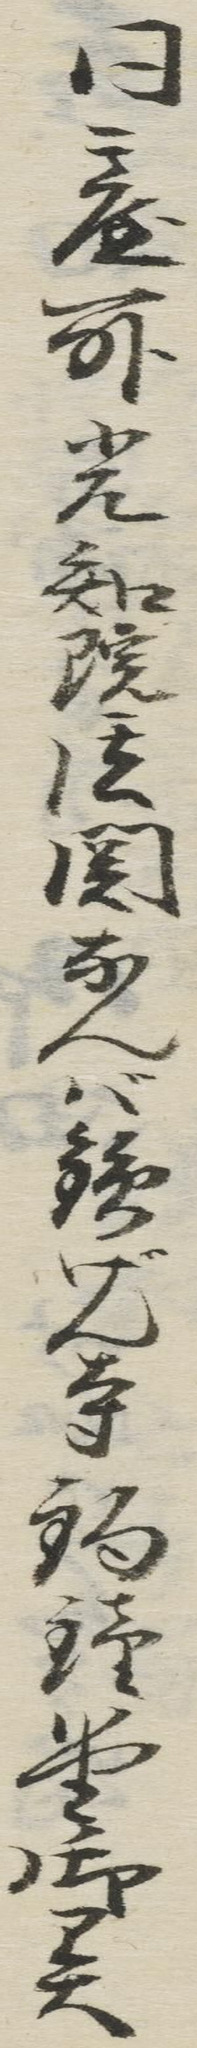同臺所光知院玄関なんバ鉄げん寺釣鐘堂御異
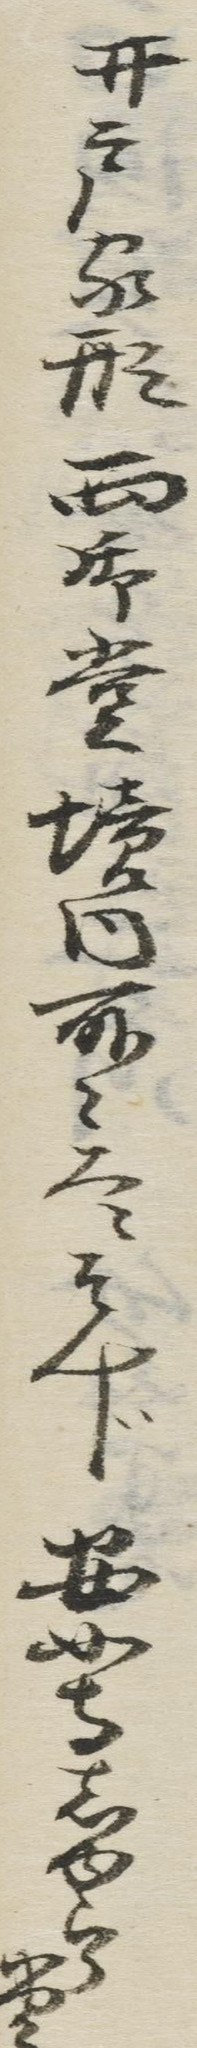井戸家形西御堂境内所々大ニそげ安如寺しやら堂
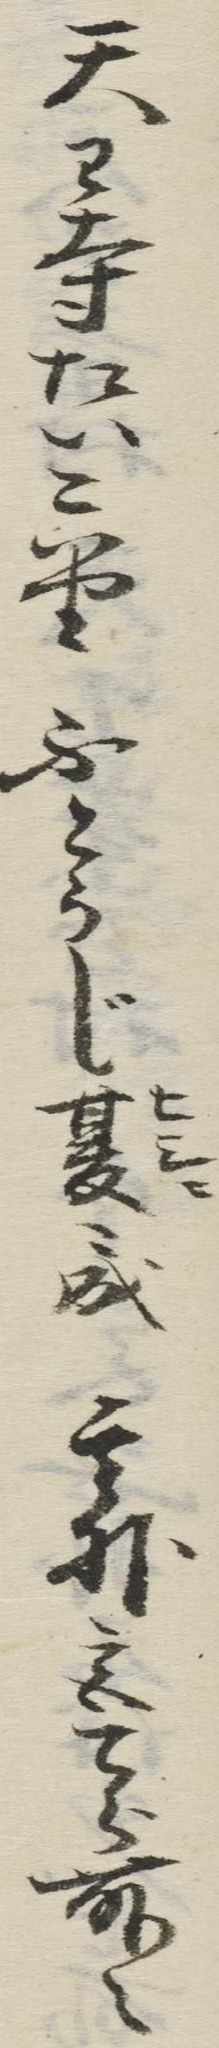天王寺たいこ堂ふとうじ菱に成其外宮てら前ニ
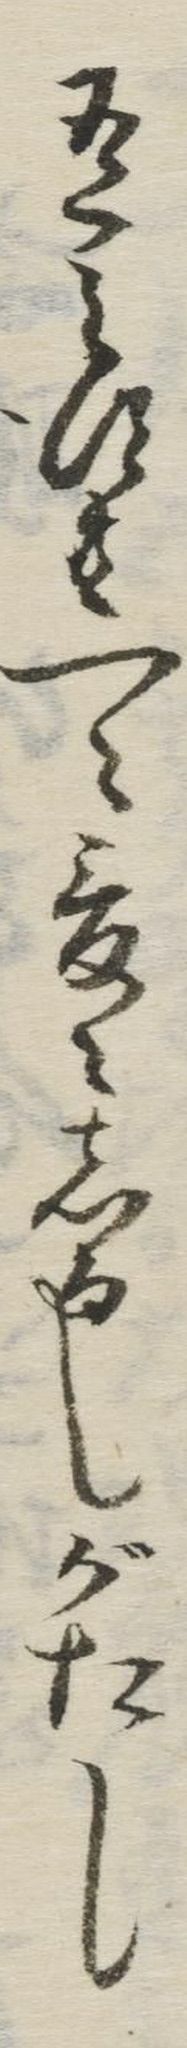有の候得共一々爰ニしるしがたし
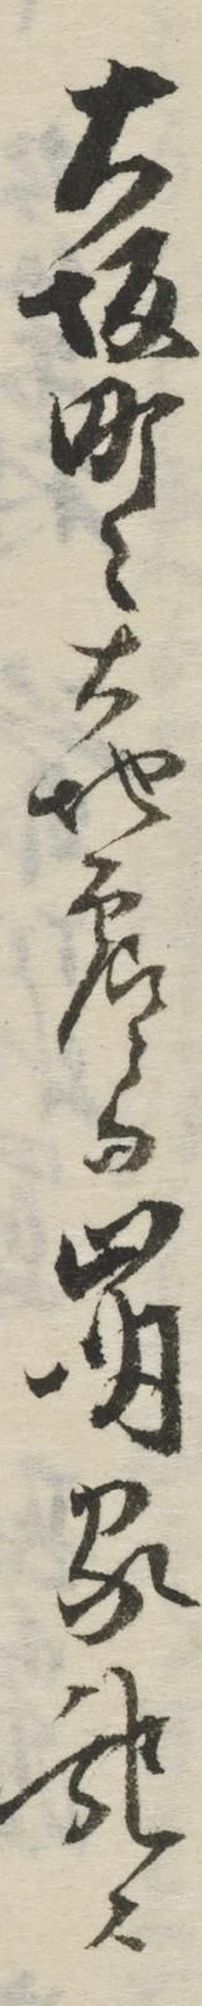大坂町々大地震ニ而崩家記ス
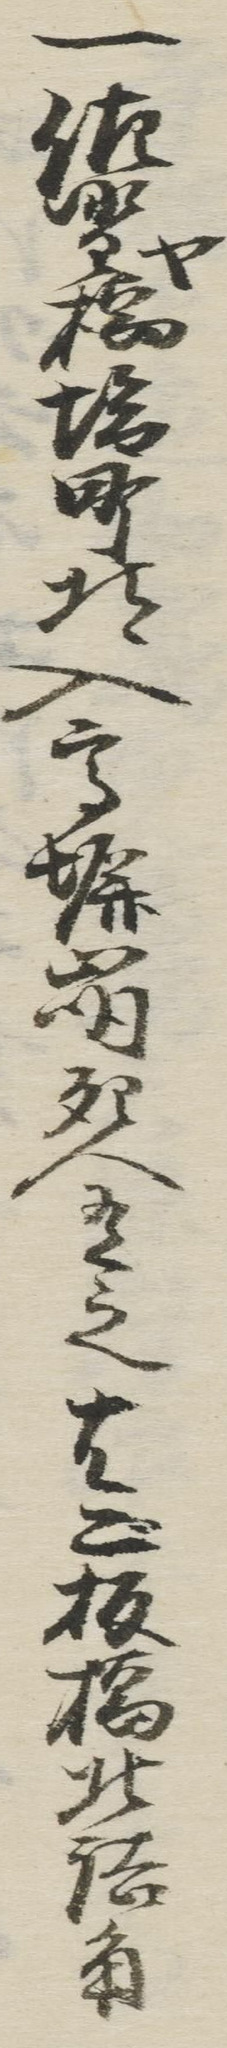一佐野ヤ橋塩町北ヘ入高塀崩死人有之はご板橋北詰角
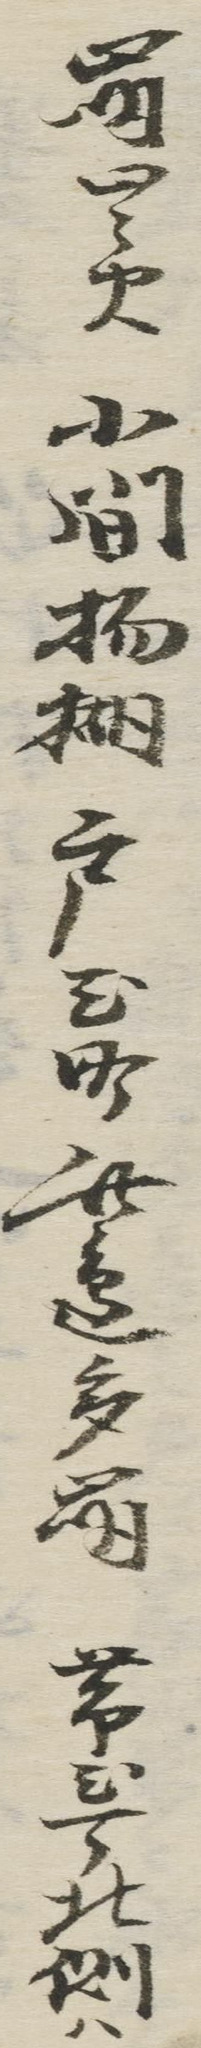崩出火小間物楜戸屋町此辺多崩帯屋丁北側ハ
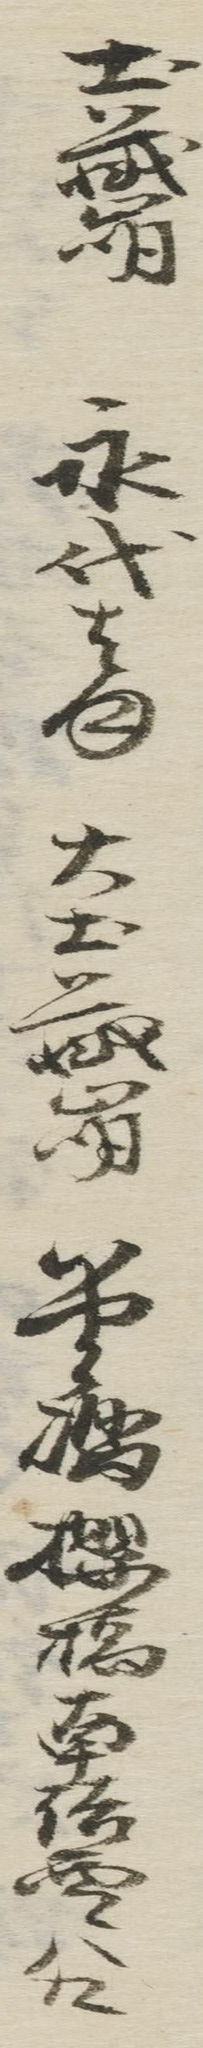土蔵崩永代はま大土蔵崩堂嶋桜橋南詰西へ八九
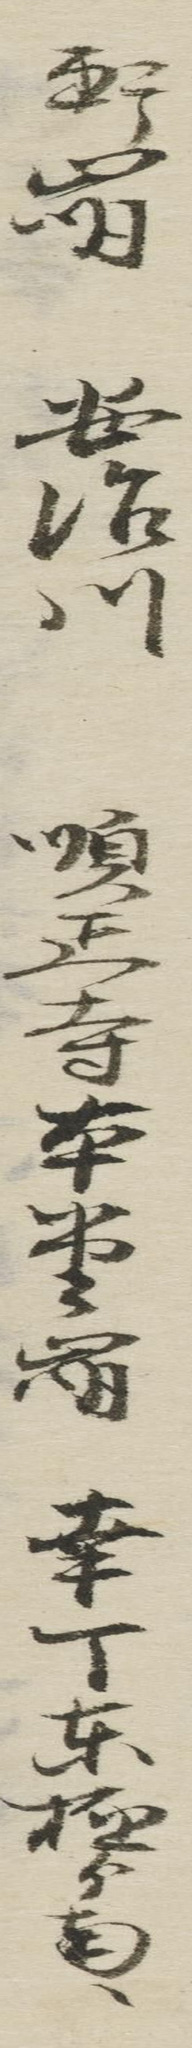軒崩安治川順正寺本堂崩幸丁東極ゟ南へ
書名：諸国大地震大津波一代記
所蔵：東京大学地震研究所図書室 Earthquake Research Institute Library, The University of Tokyo, JAPAN
